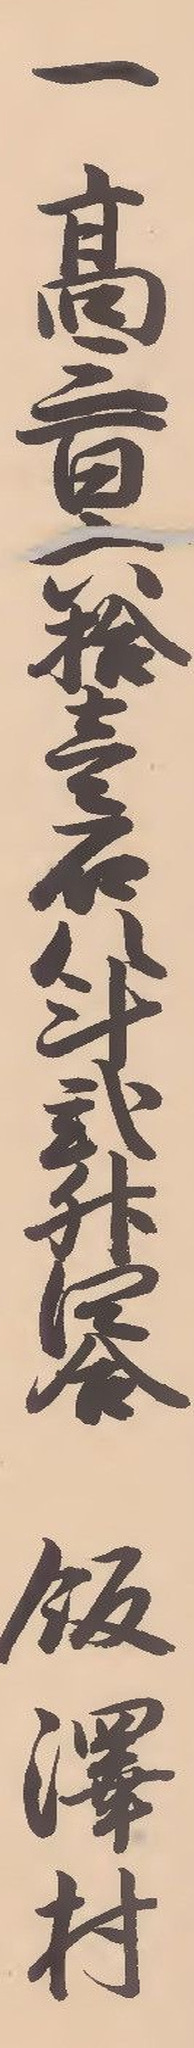一高三百六拾壱石八斗弐升四合飯沢村
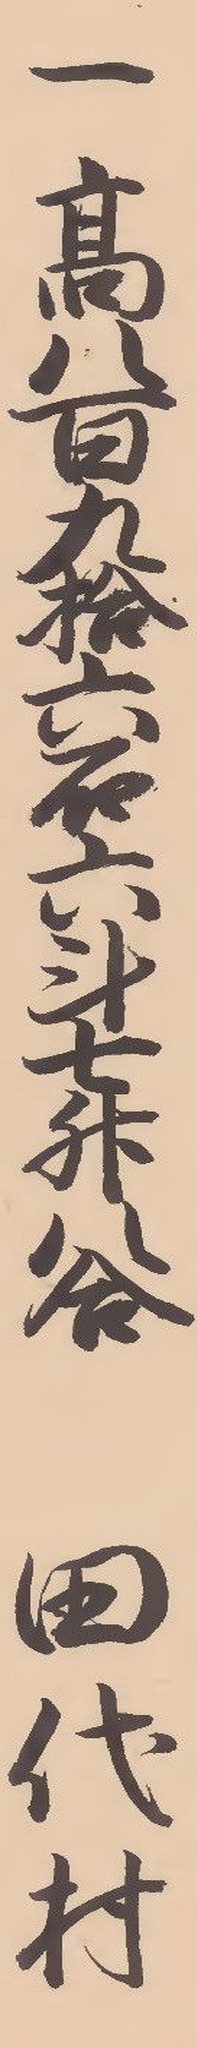一高八百九拾六石六斗七升八合田代村
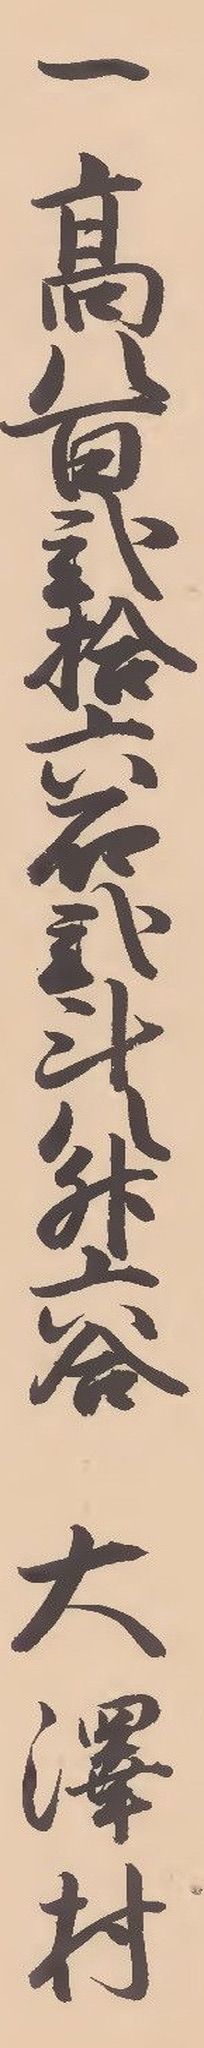一高八百弐拾六石弐斗八升六合大沢村
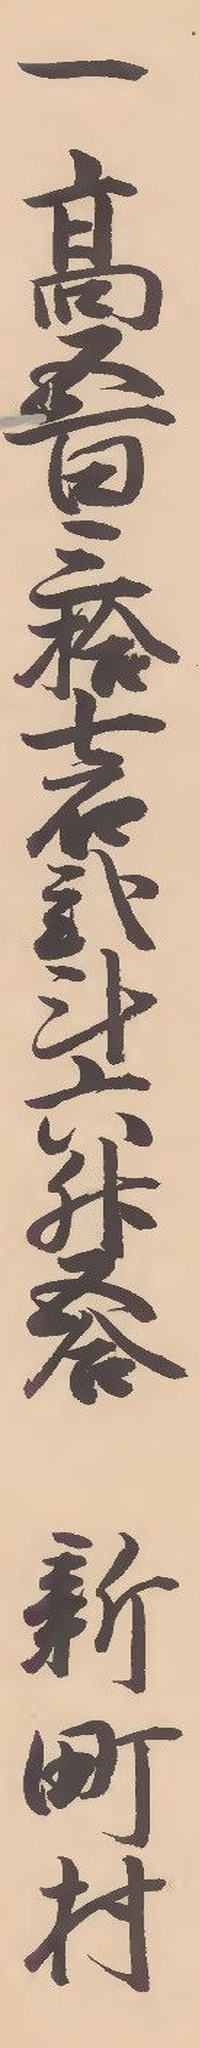一高百五三拾七石弐斗六升五合新町村

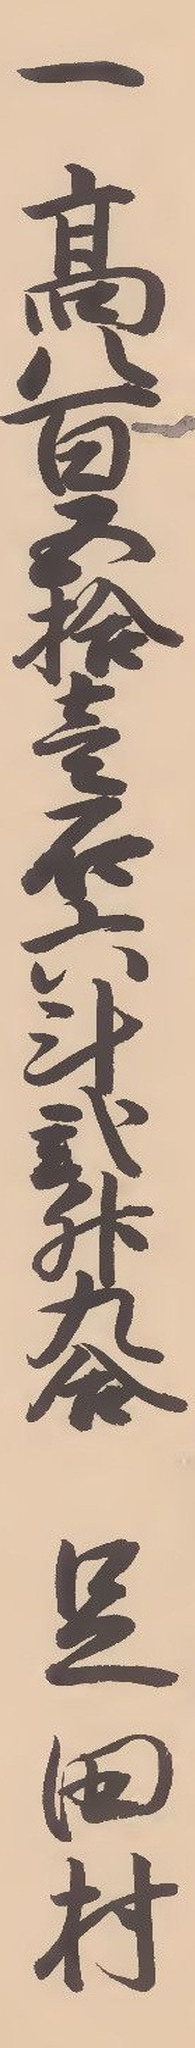一高八百五拾壱石六斗弐升九合足田村
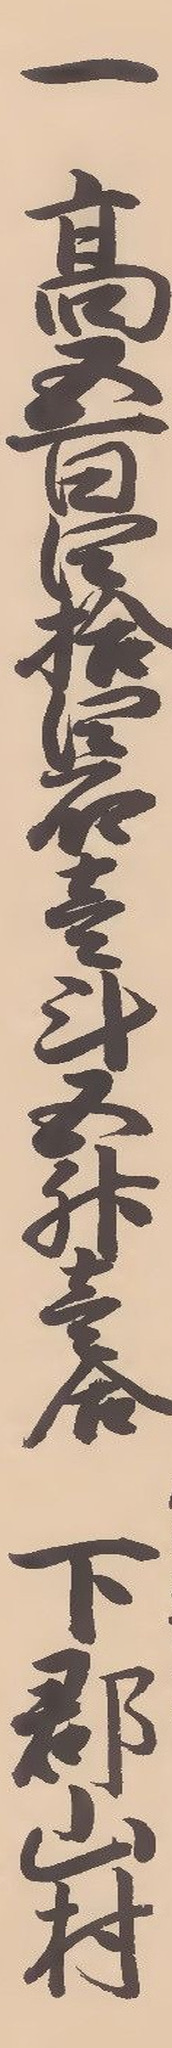一高五百四拾四石壱斗五升壱合下郡山村
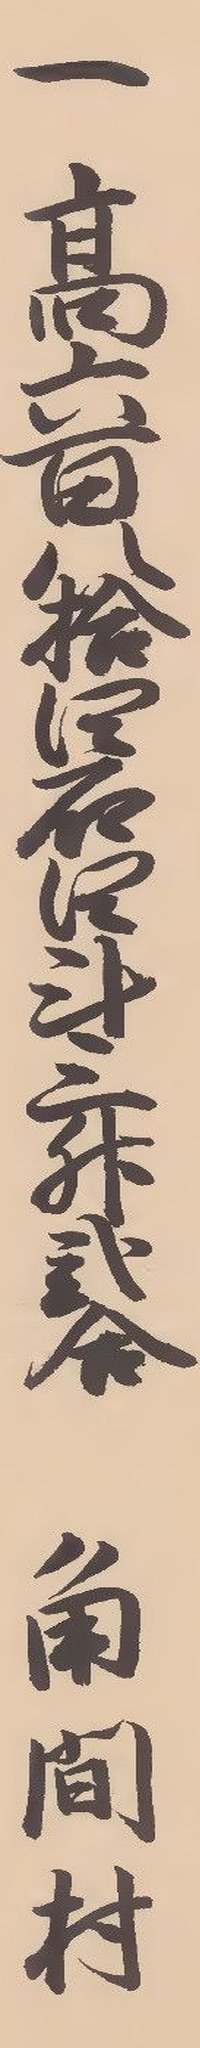一高六百八拾四石四斗三升弐合角間村
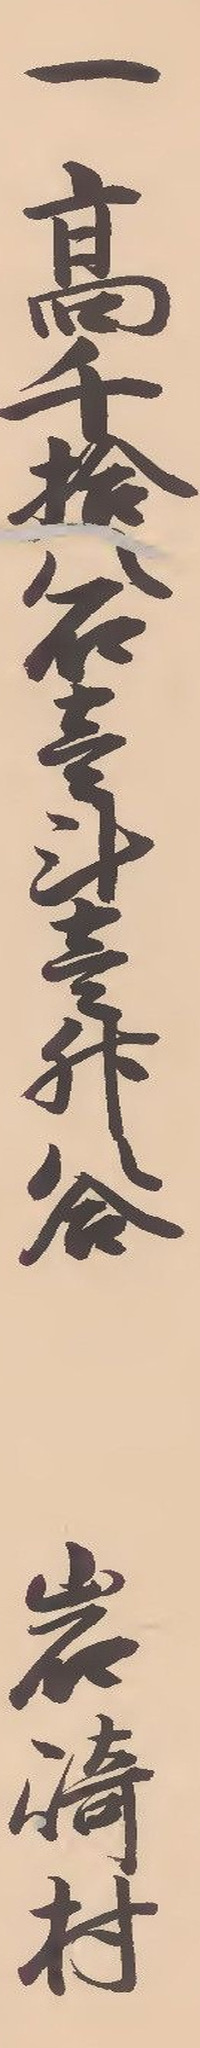一高千拾八石壱斗壱升八合岩崎村
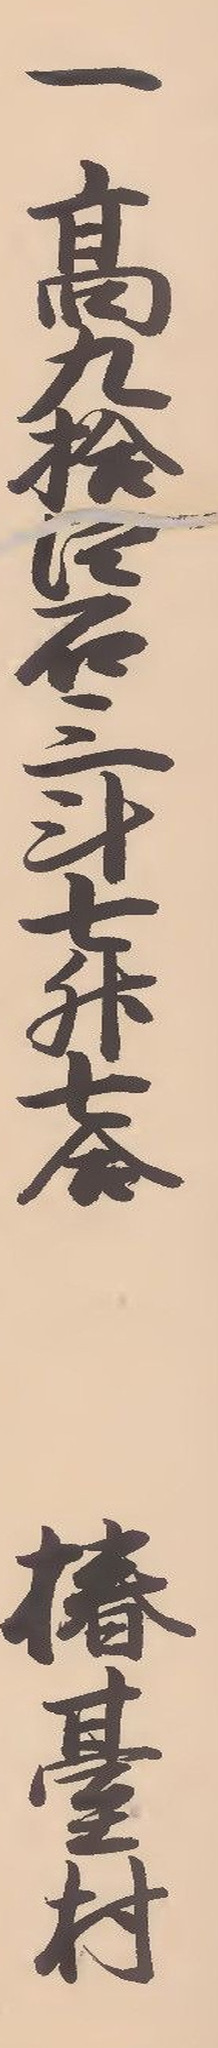一高九拾四石三斗七升七合椿台村
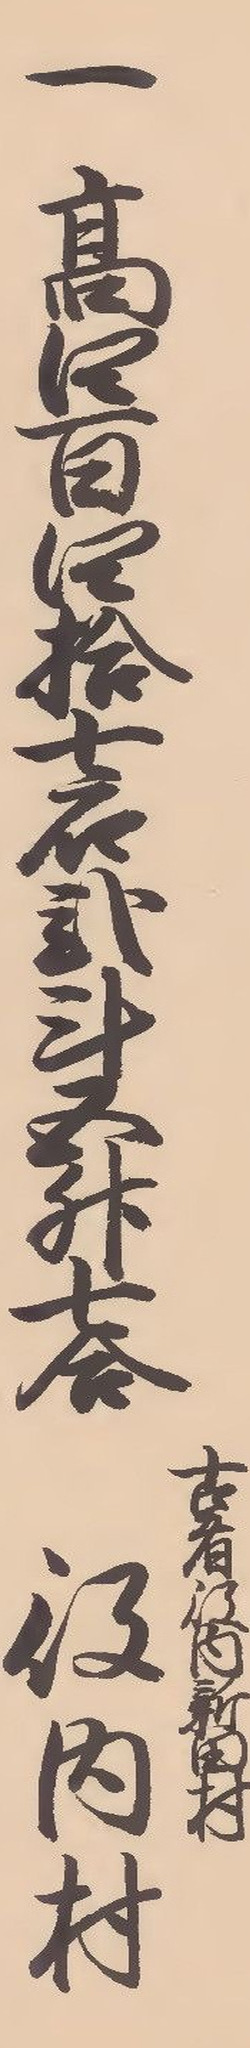一高四百四拾七石弐斗五升七合役内村
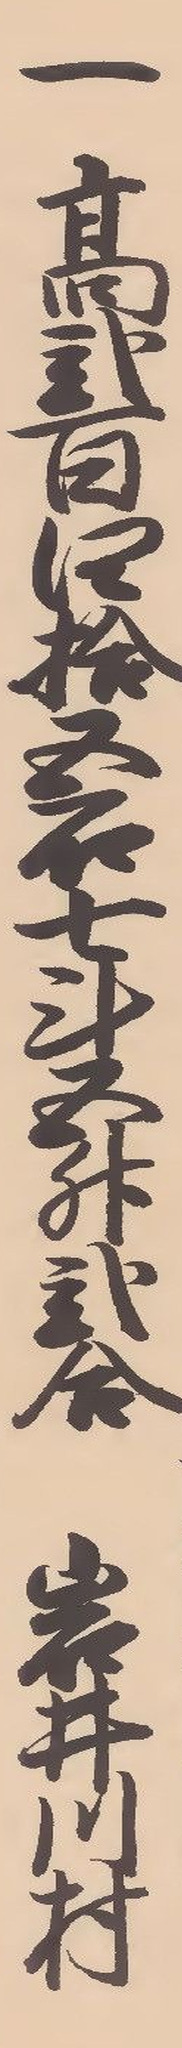一高弐百四拾五石七斗五升弐合岩井川村
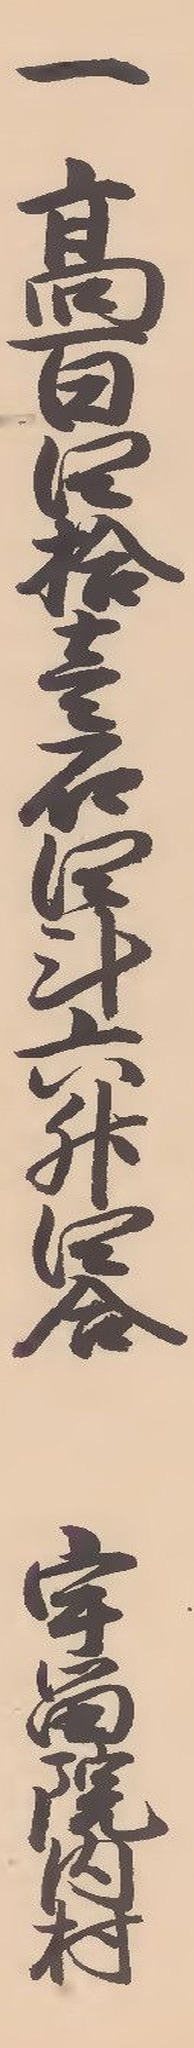一高百四拾壱石四斗六升四合宇留院内村

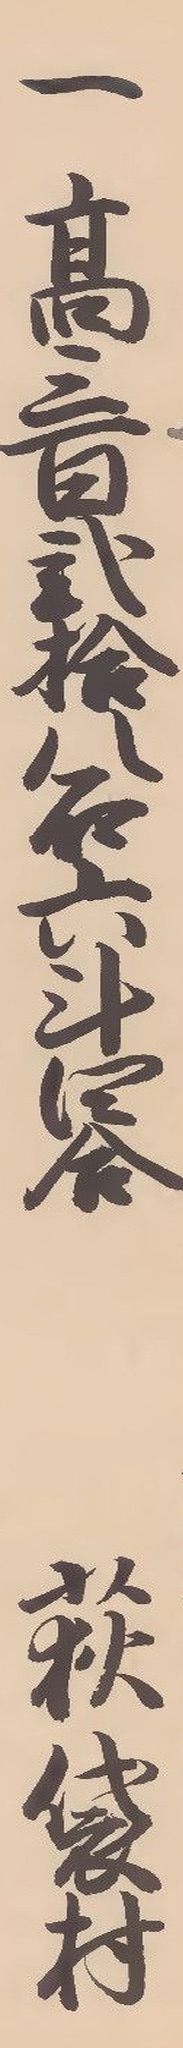一高三百弐拾八石六斗四合萩袋村
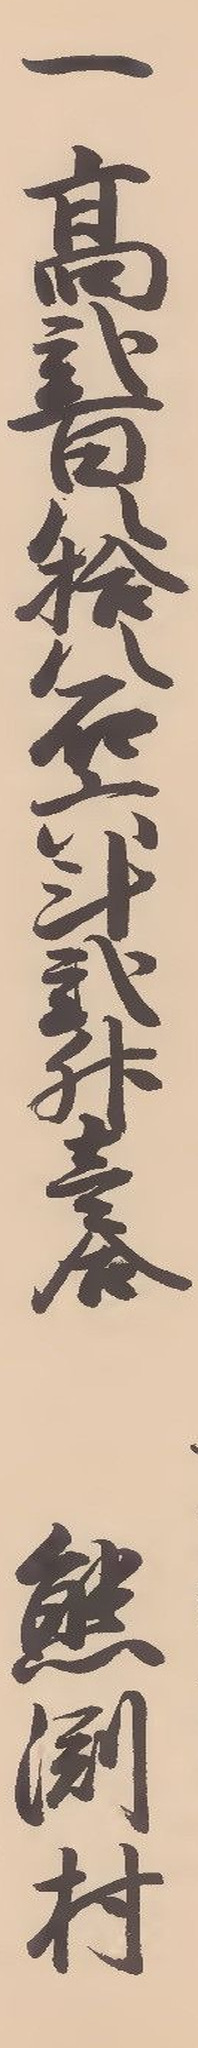一高弐百八拾八石六斗弐升壱合熊淵村
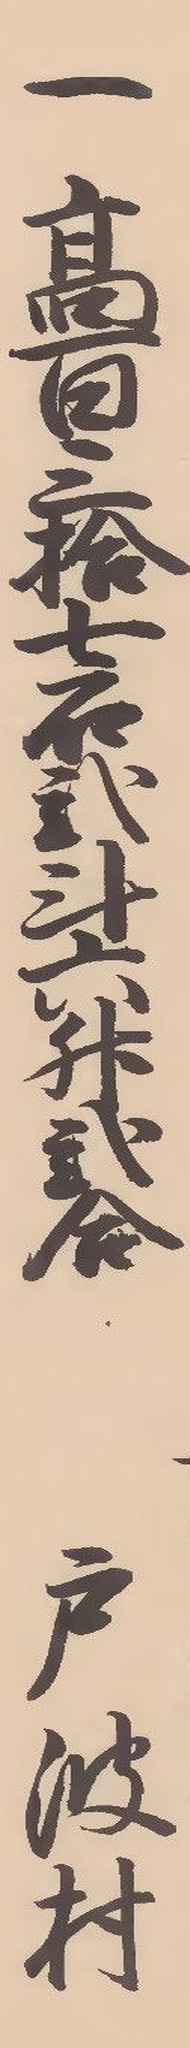一高百三拾七石弐斗六升弐合戸波村
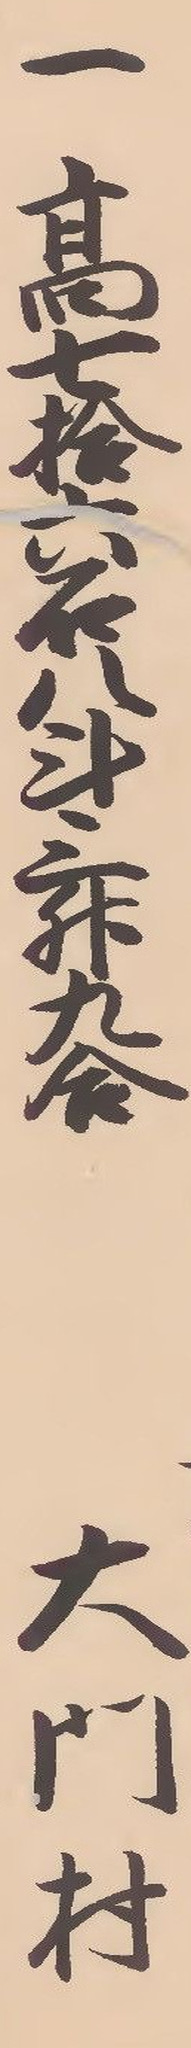一高七拾六石八斗三升九合大門村
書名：出羽国郷帳　５
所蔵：国立公文書館 National Archives of Japan
